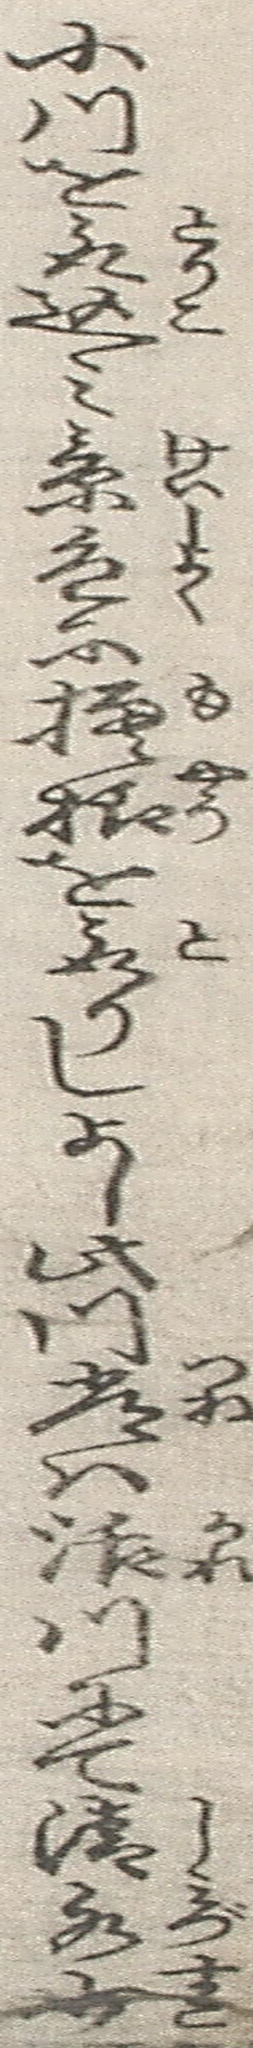小川を取込ミ景色に模様を取りしよし此川常ハ涸川にて清水少
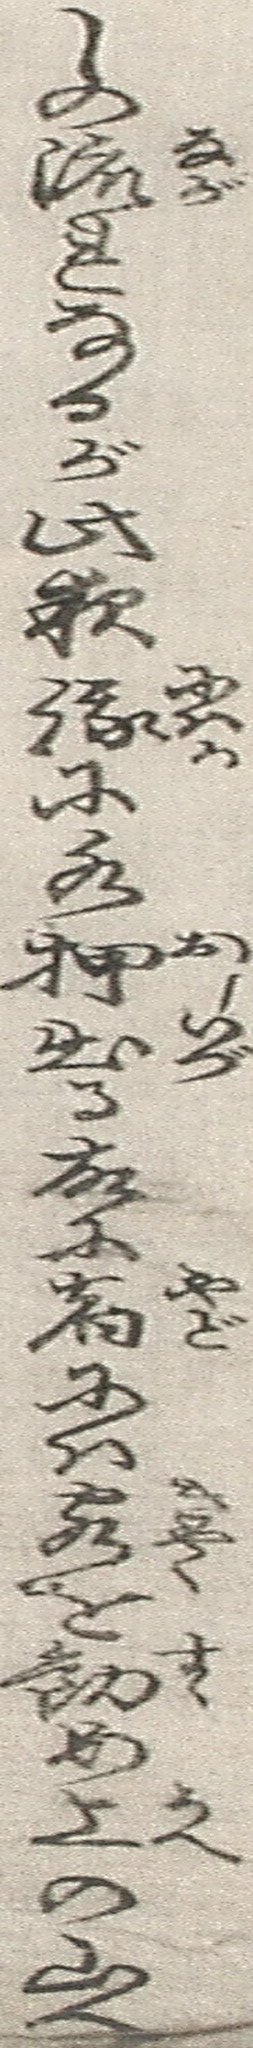しの流れなるが此夜俄に水押出る故に宿にハ客を勧め上の山へ
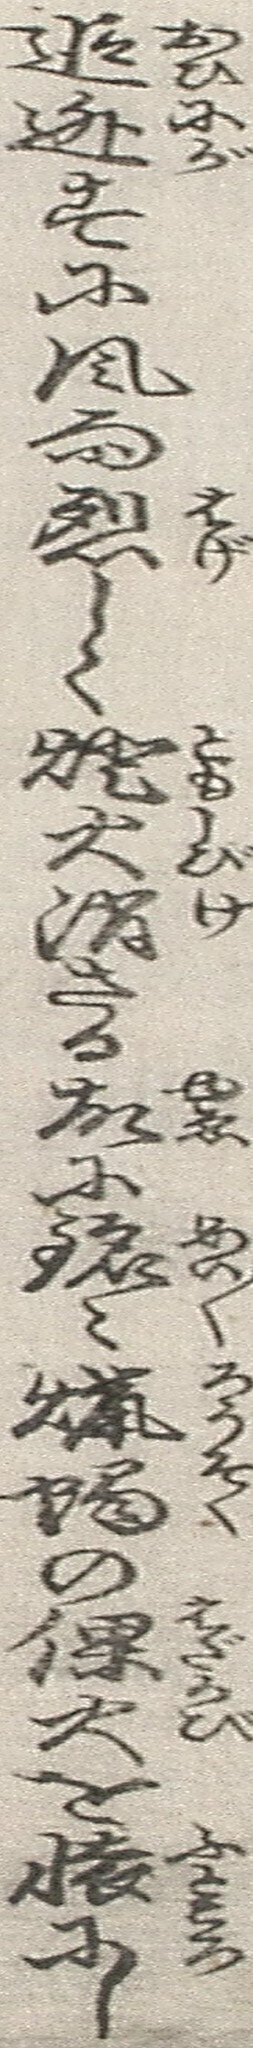追逃すに風雨烈しく燈火消さる故に銘々蝋燭の倮火を懐にし
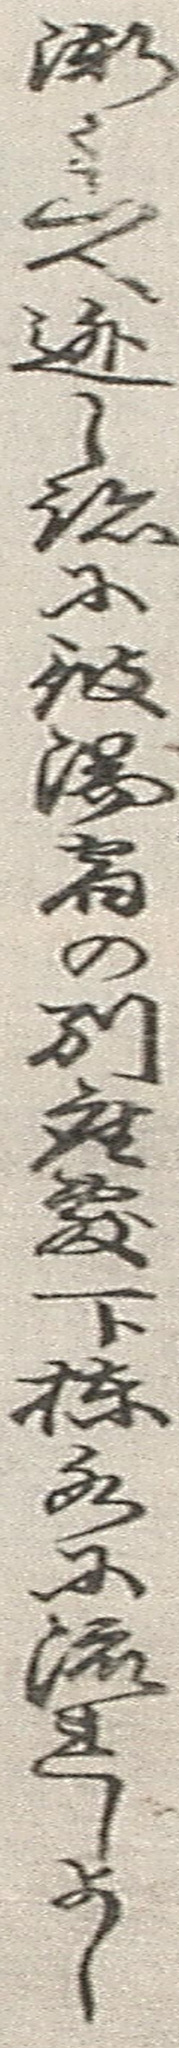漸々山へ逃し後に彼湯宿の別座敷下棟水に流れしよし
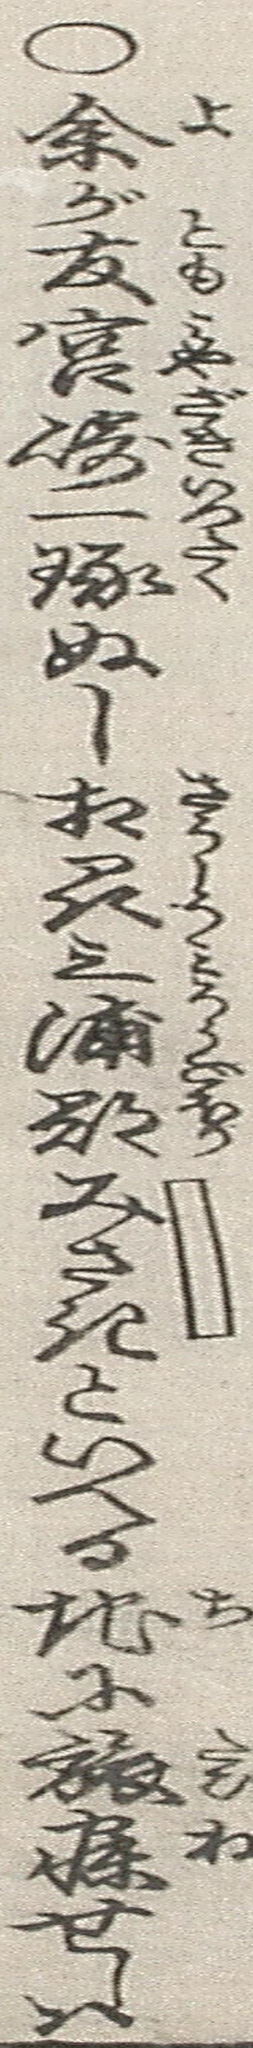◯余が友宮崎一琢ぬし相州三浦郡みさきといへる地に旅寐せしハ
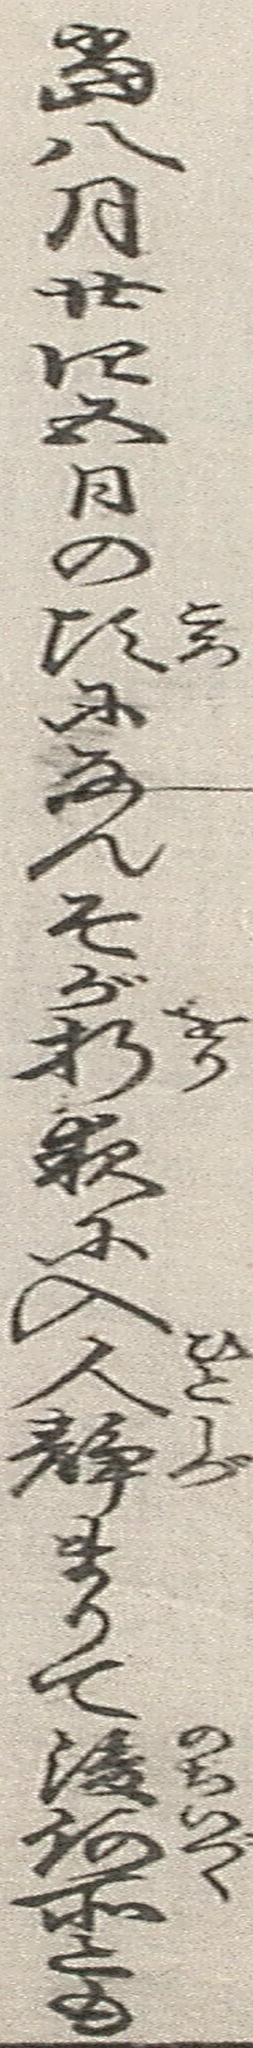当八月廿四五日の頃になんそが折夜に入人静まりて後何所とも
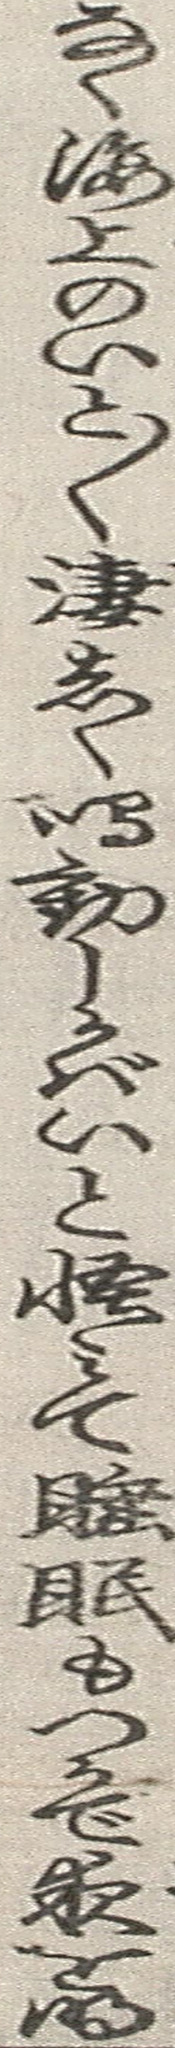なく海上のいと〳〵凄しく鳴動しかバいと怪ミて睡眠もつかで夜を明
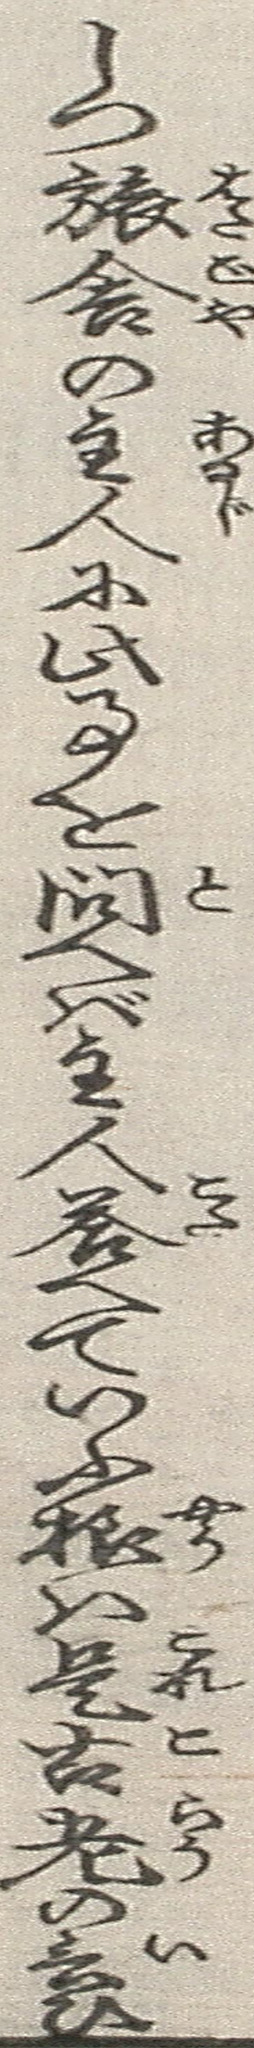しつ旅舎の主人に此事を問へバ主人答へていふ様ハ是古老の言ひ
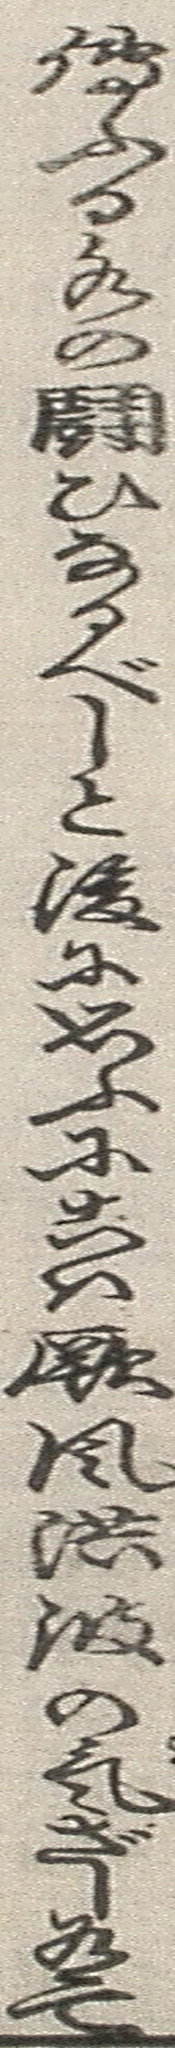伝ふる水の闘ひなるべしと後に思ふにこハ厭風洪波の気ざし有て
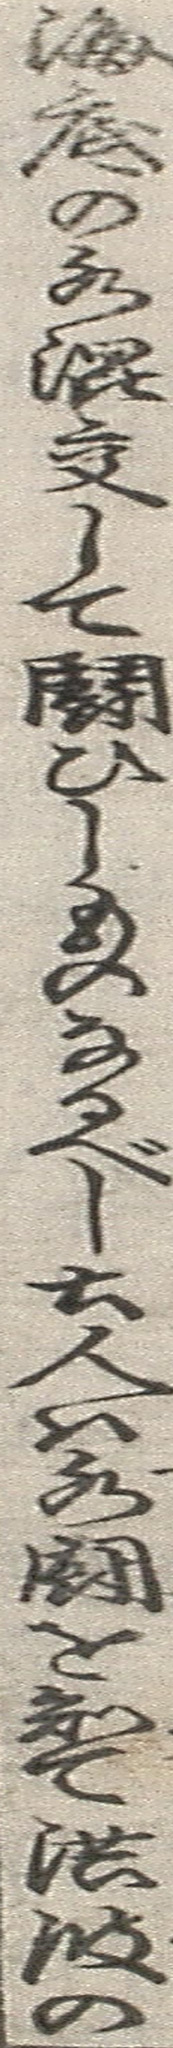海底の水混交して闘ひしものなるべし土人ハ水闘を知て洪波の
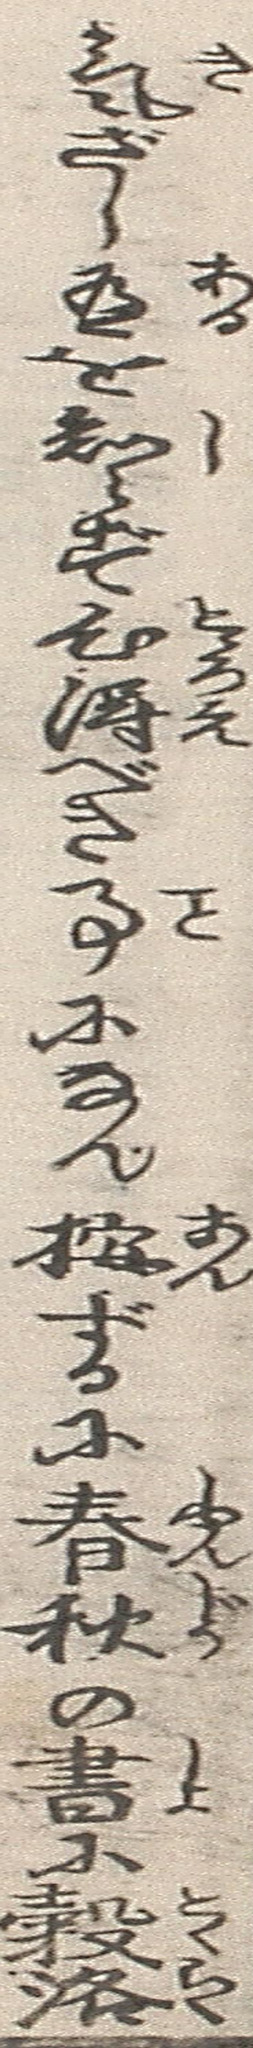気ざし有を知らず心得べき事になん按ずるに春秋の書に穀洛
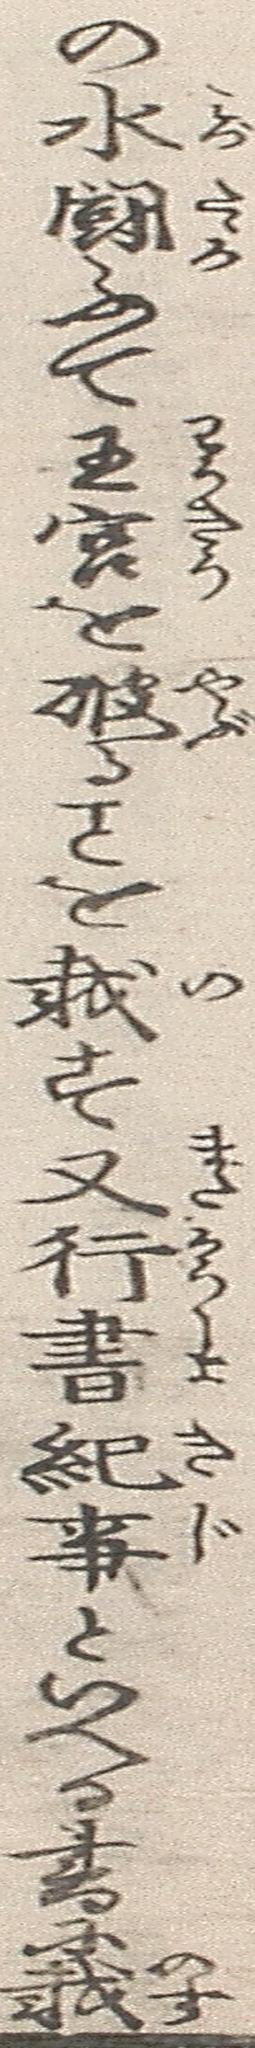水闘ふて王宮を破ることを戴す又行書紀事といへる書に戴
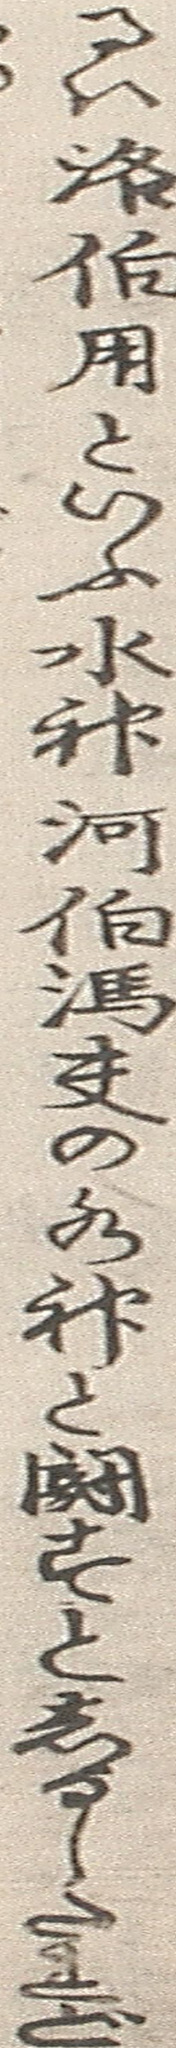るハ洛伯用といふ水神河伯馮夫の水神と闘すとしるしたれど
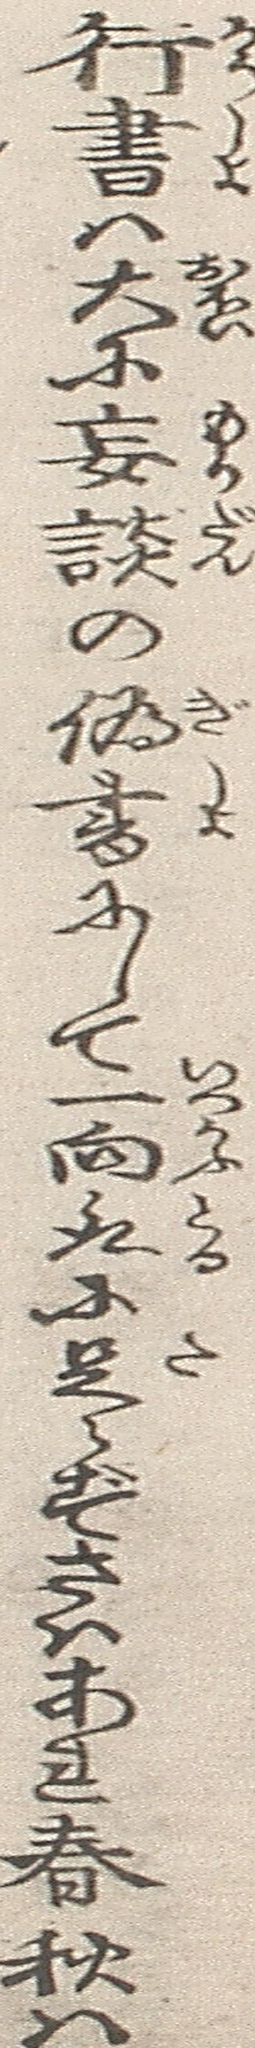行書ハ大に妄談の偽書にして一向取に足らずさハあれ春秋ハ
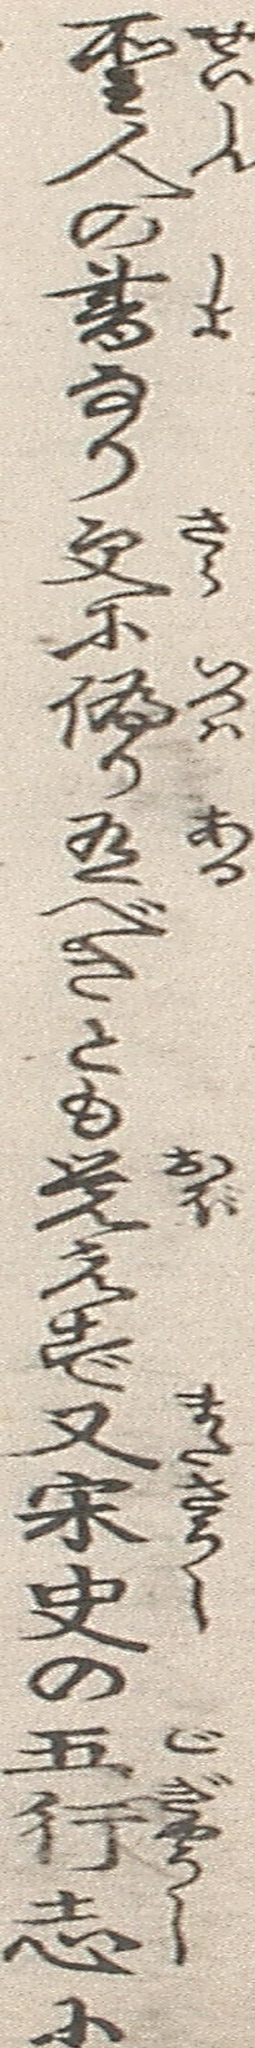聖人の書なり更に偽り有べきとも覚えず又宋史の五行志に
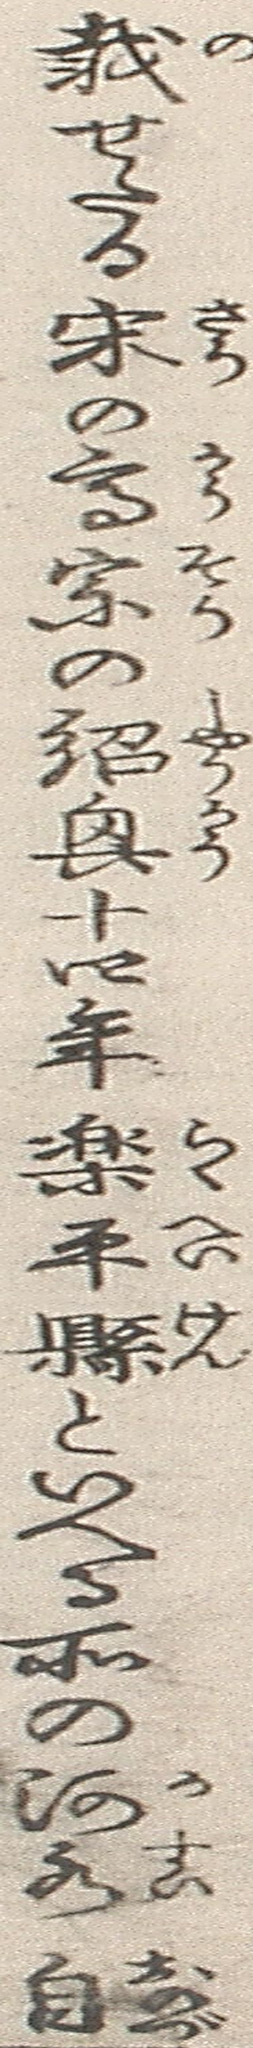戴せたる宋の高宗の紹興十四年楽平県といへる所の河水自
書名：安政風聞集　上中下　全
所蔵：東京大学地震研究所図書室 Earthquake Research Institute Library, The University of Tokyo, JAPAN
